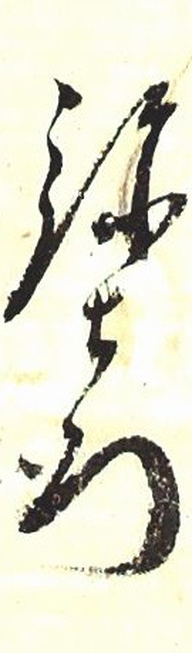弥右衛門
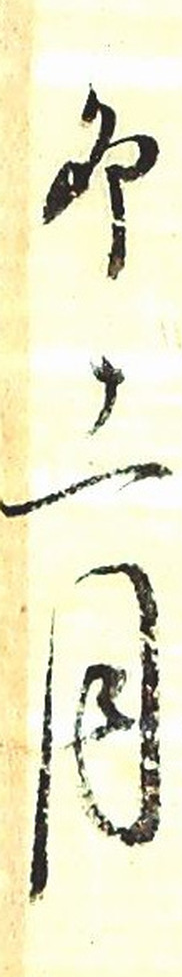卯十一月
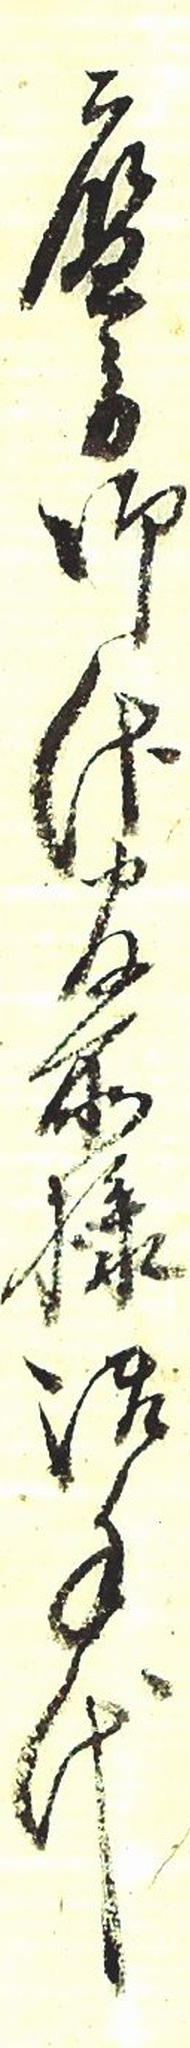藍方御代官所様御手代
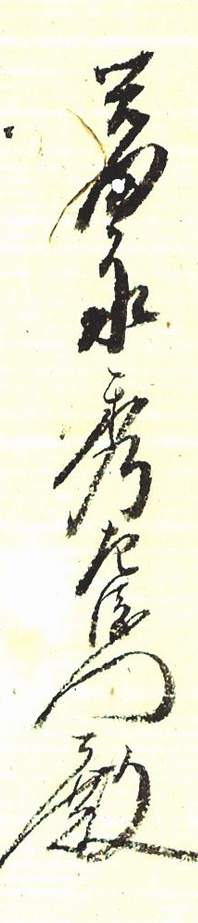富永秀左衛門殿
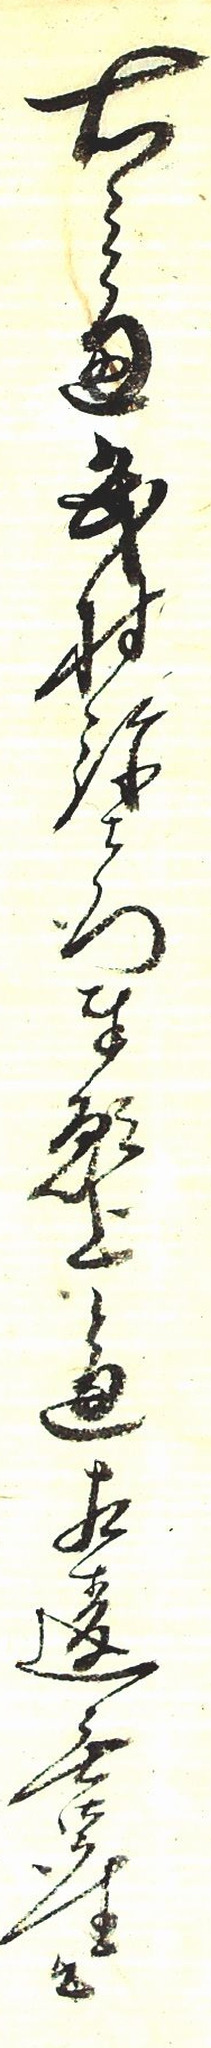右之通当村弥右衛門奉願上候通相違無御座候
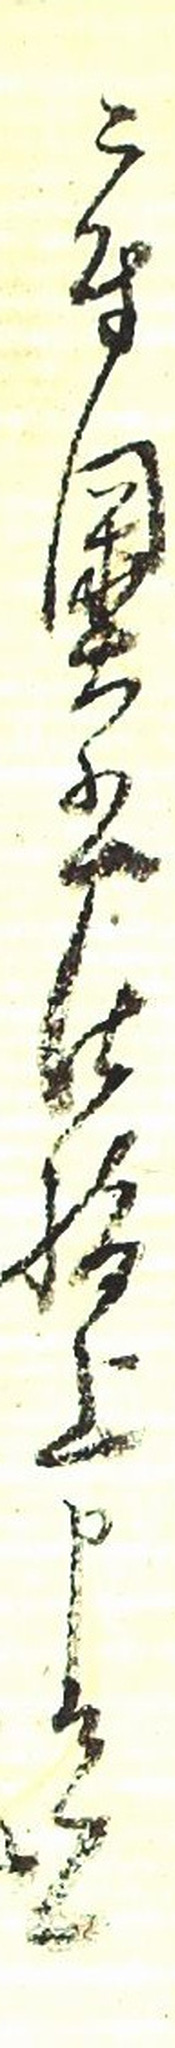に付奥書仕指上申候以上
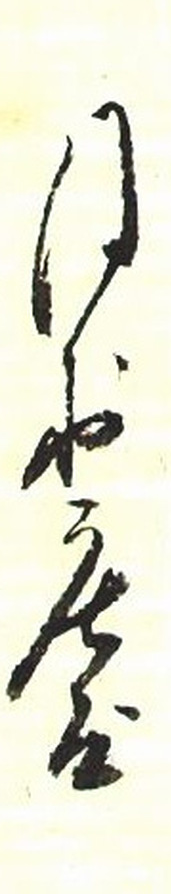同村庄屋
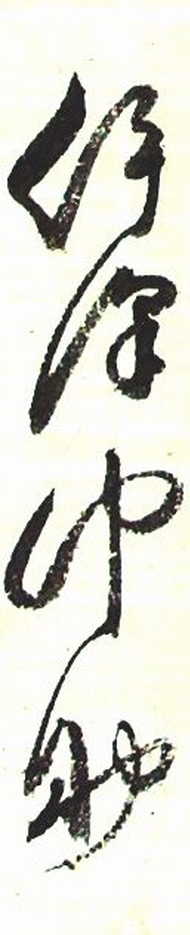伊沢仲助
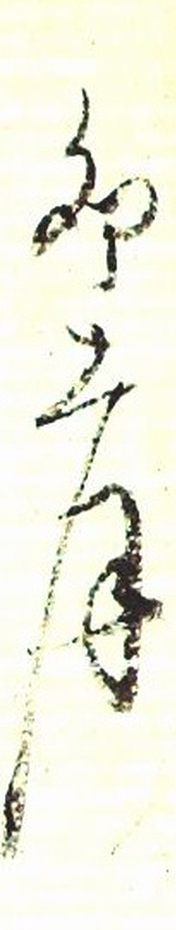卯十一月
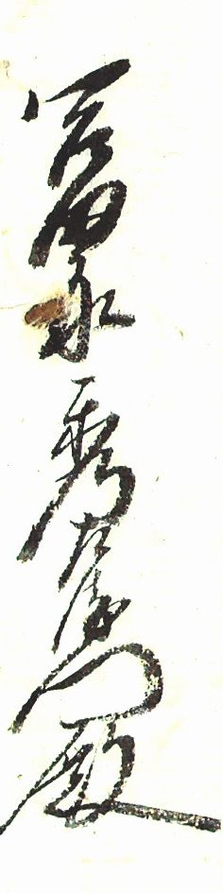富永秀左衛門殿

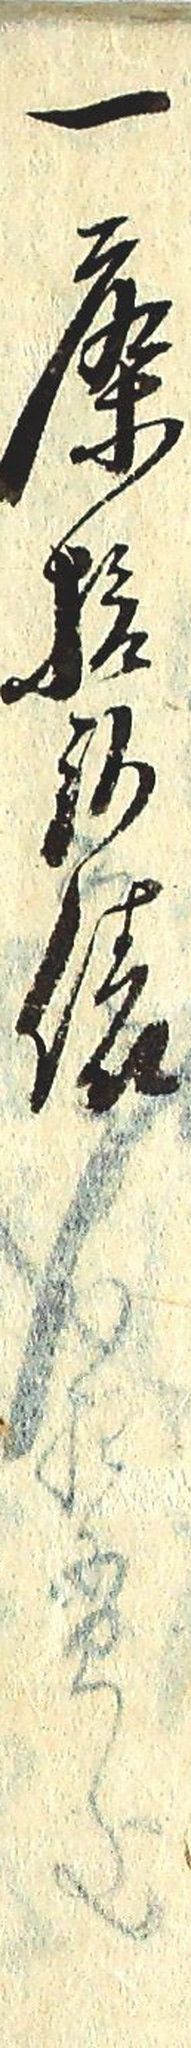一蒅拾弐俵
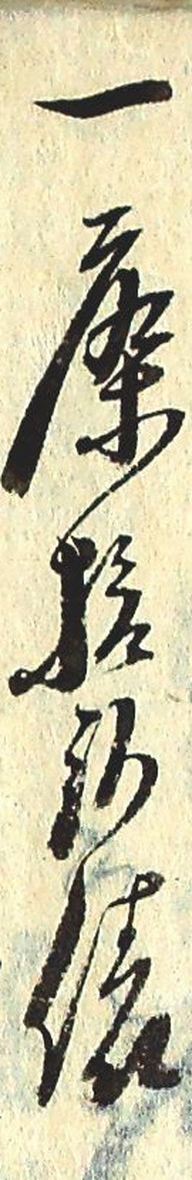一蒅拾弐俵
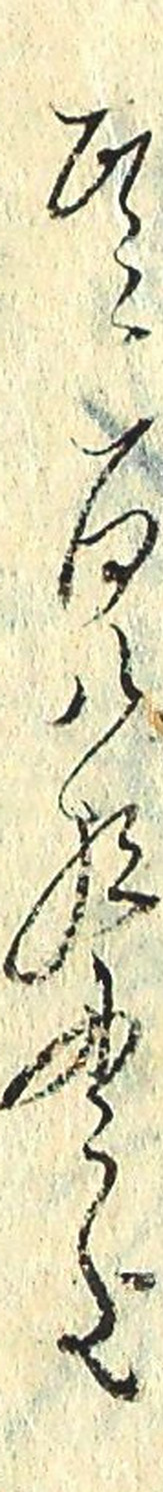正み百八拾貫匁
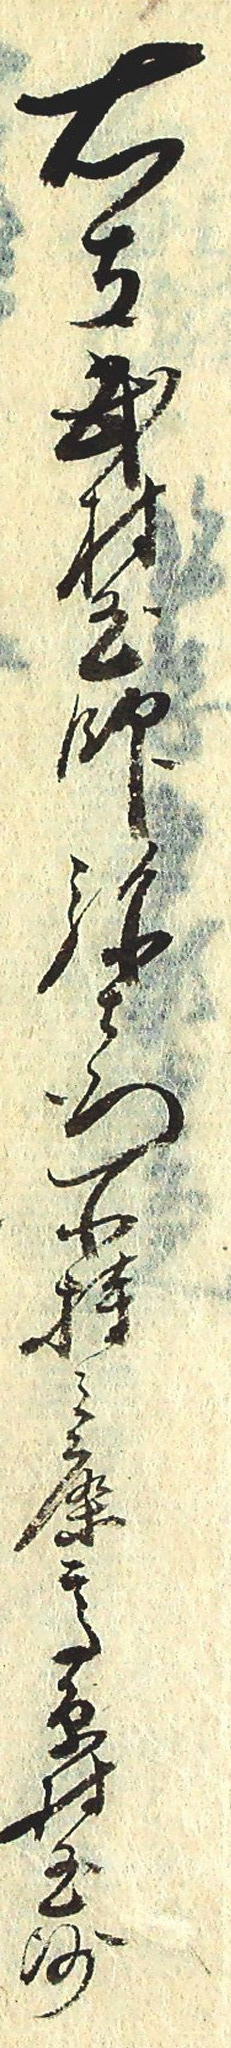右は当村玉師弥右衛門所持之蒅高原村玉師
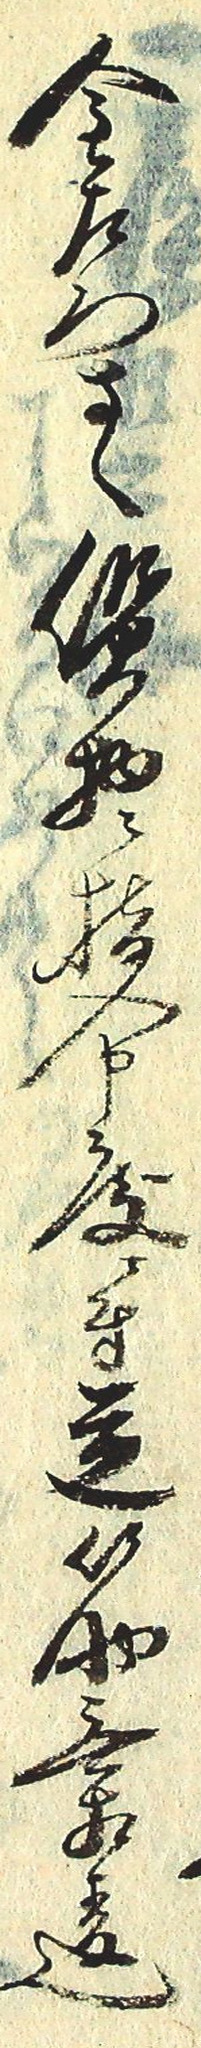金左衛門方へ質物に指入申度に付道筋無相違
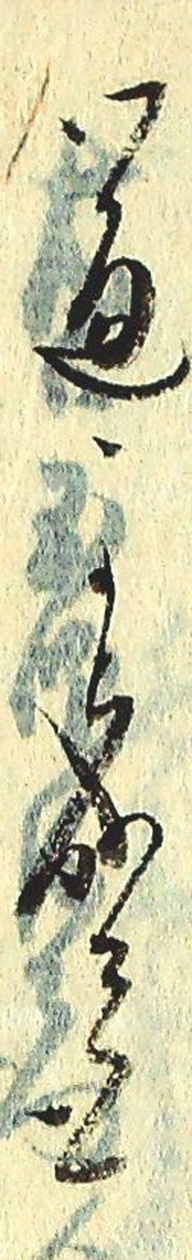御通可被成候以上
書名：諸御願書控(弐番）
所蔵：鳴門教育大学 Naruto University of Education
